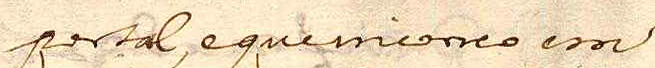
por tal, e que incorreo em
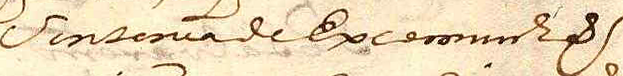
Sentença de Excomunhaõ
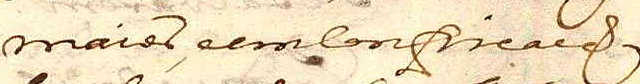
maior, e em confiscaçaõ
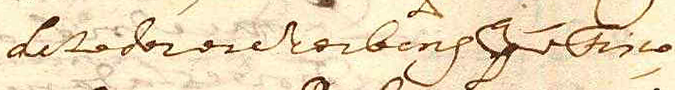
de todos os seos bens pa o Fisco,
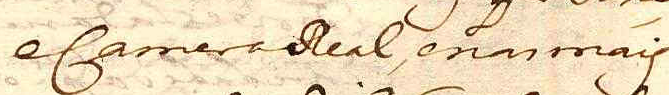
e Camera Real, e nas mais
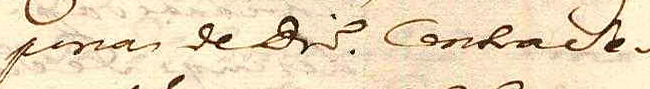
penas de Dr.o Contra Se
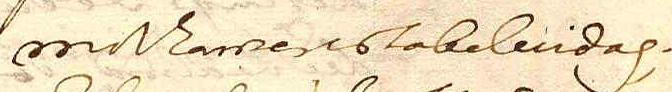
milhantes estabelecidas;
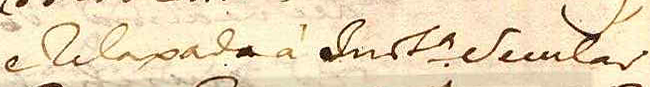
e Relaxada a Iust.a Secular
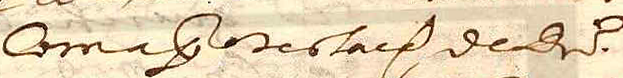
Com a protestacaõ de Dr.o
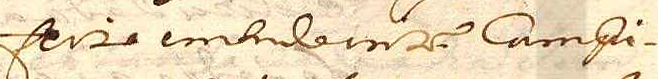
feito em todo intr.o CumpRi
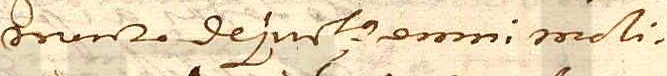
mento de just.a omni meli
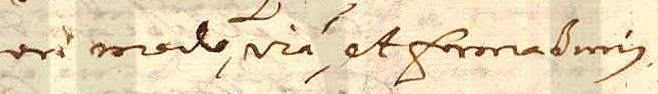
ori modo, via, et forma Iuris.
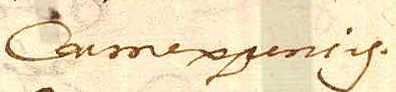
Cum expensis.
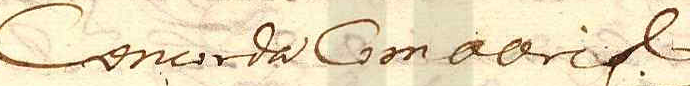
Concorda Com o orig.l
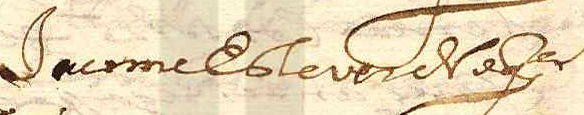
Iacome Esteves Nogra
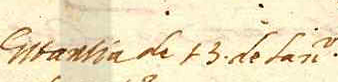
Estansia de 13. de Ian.ro
